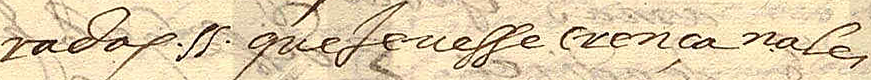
radas .ss. que teuesse crença na lei
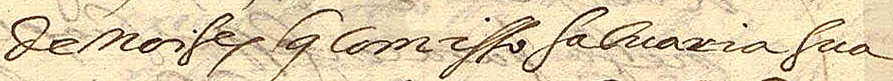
de Moises q̄ com isso saluaria sua
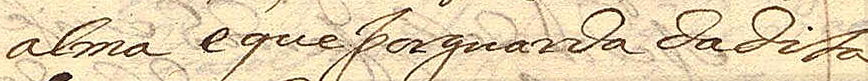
alma e que por guarda da dita
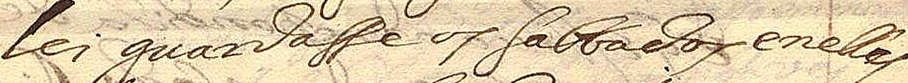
lei guardasse os sabbados e nelles
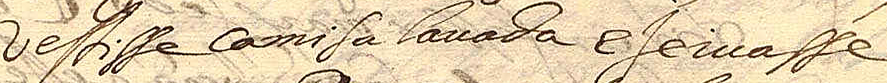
vestisse camisa lauada e Jeiuasse
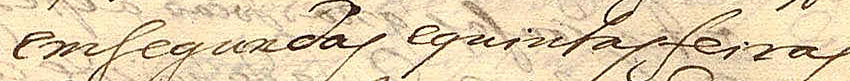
em segundas e quintas feiras
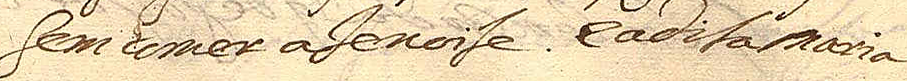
sem comer ate noite. e a dita Maria
